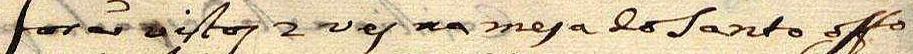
foraõ uistos 2 ues na mesa do Santo offo
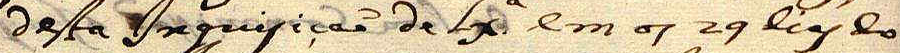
desta Jnquisiçaõ de Lx.a em os 29 dias do
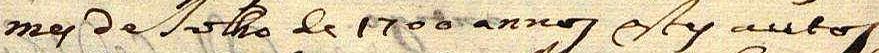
mes de Iulho de 1700 annos estes autos
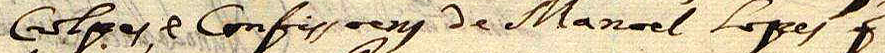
Culpas, e Confissoens de Manoel Lopes q̄
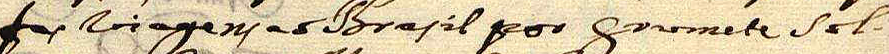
fas viagens ao Brasil por grumete sol
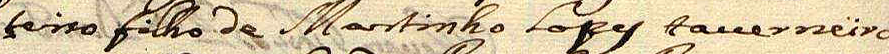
teiro filho de Martinho Lopes tauerneiro
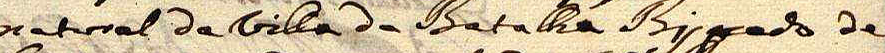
natural da Villa da Batalha Bispado de
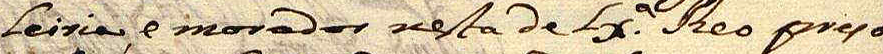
Leiria, e morador nesta de Lx.a Reo preso
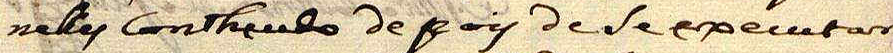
nelles contheudo depois de se executar
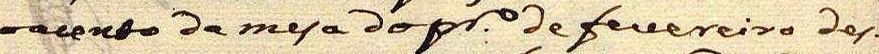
o acento da mesa do pr.o de feuereiro des
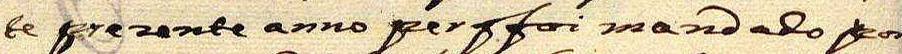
te prezente anno per q̄ foi mandado por
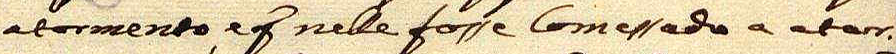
a tormento, e q̄ nelle fosse Comessado a atar.
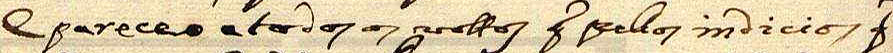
E pareceo a todos os uottos q̄ pellos indicios q̄
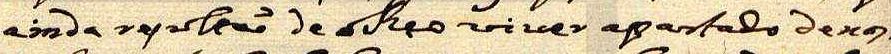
ainda resultaõ de o Reo uiuer apartado de nos
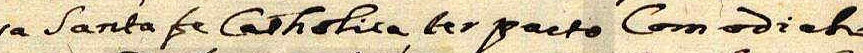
sa Santa fe Catholica, ter pacto Com o diabo
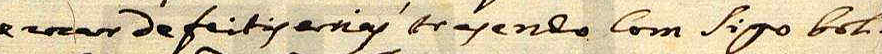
e uzar de feitisarias trasendo Comsigo bol
